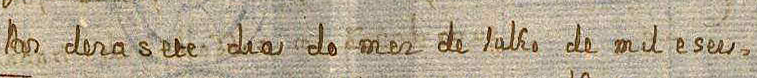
Aos dezasete dias do mez de Iulho de mil e seis
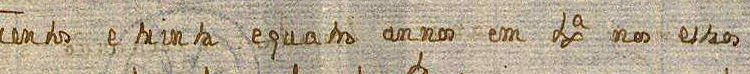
centos e trinta e quatro annos em Lxa nos estaos
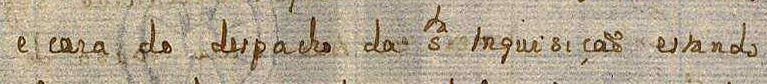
e caza do despacho da sta Inquisiçaõ estando
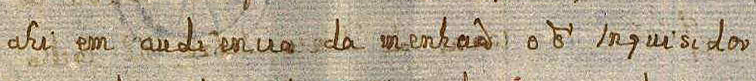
ahi em audiencia da menhaā o sor Inquisidor
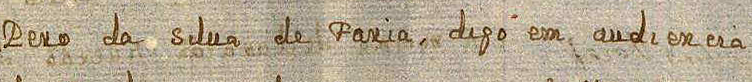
Pero da Silua de Faria digo em audiencia
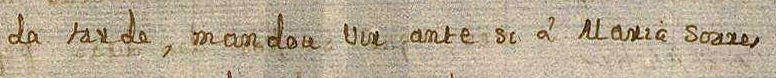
da tarde, mandou vir ante si á Maria Soares
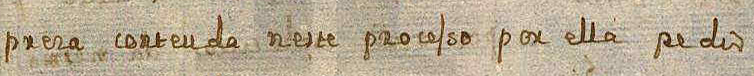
preza conteuda neste processo por ella pedir
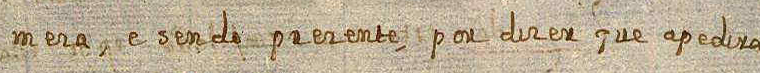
meza, e sendo prezente, por dizer que a pedira
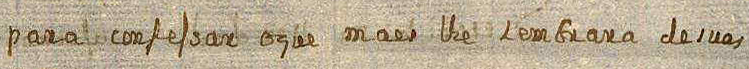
para confessar o que maes lhe lembrara de suas
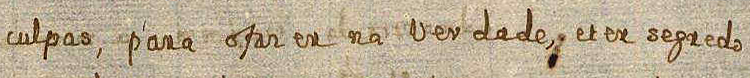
culpas, para o fazer na verdade, e ter segredo
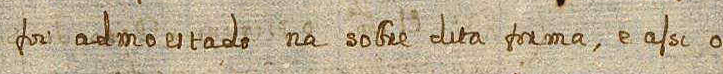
foi admoestado na sobredita forma, e assi o
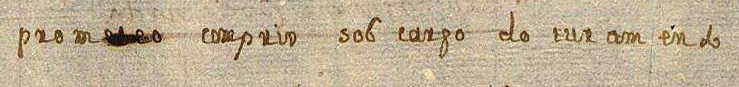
prometeo comprir sob cargo do iuramento
